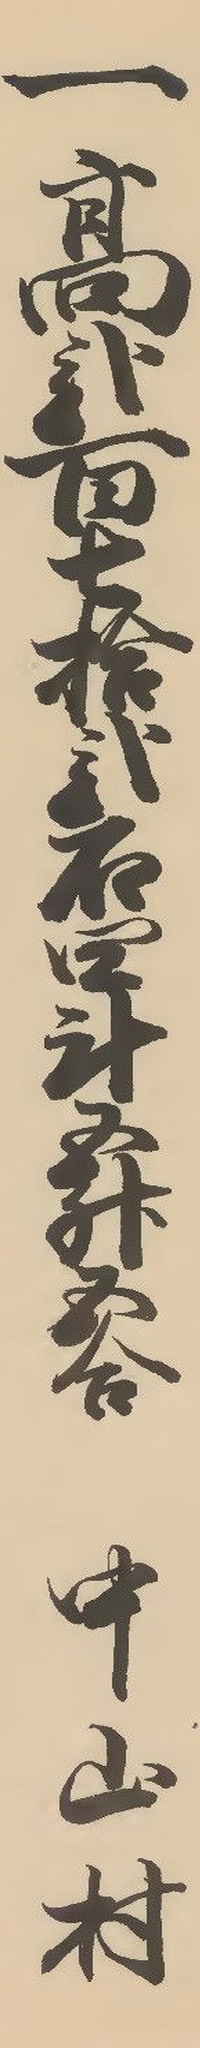一髙弐百七拾弐石四斗五升五合中山村
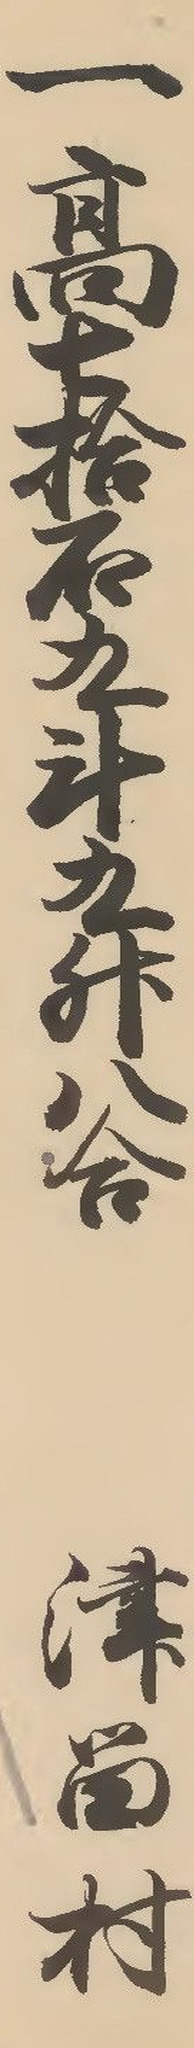一髙七拾石九斗九升八合津留村
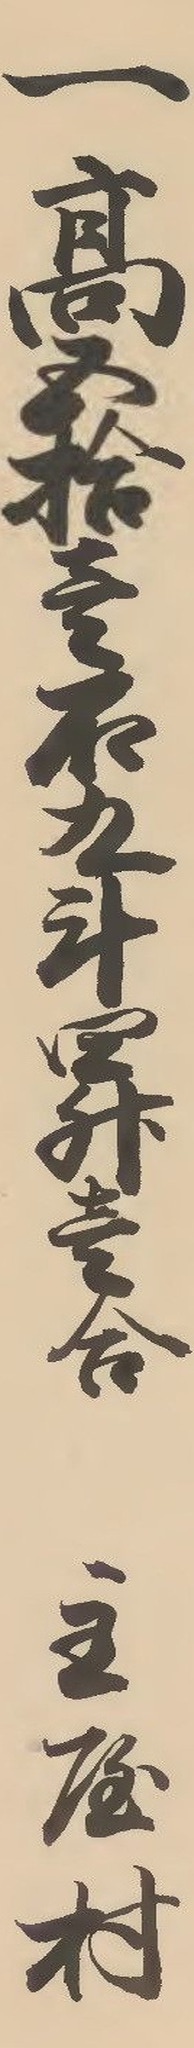一髙五拾壱石九斗四升壱合主屋村
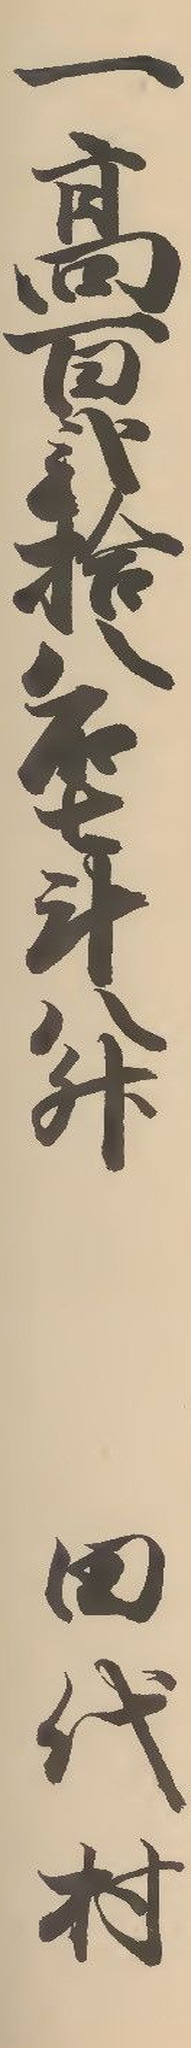一髙百弐拾八石七斗八升田代村
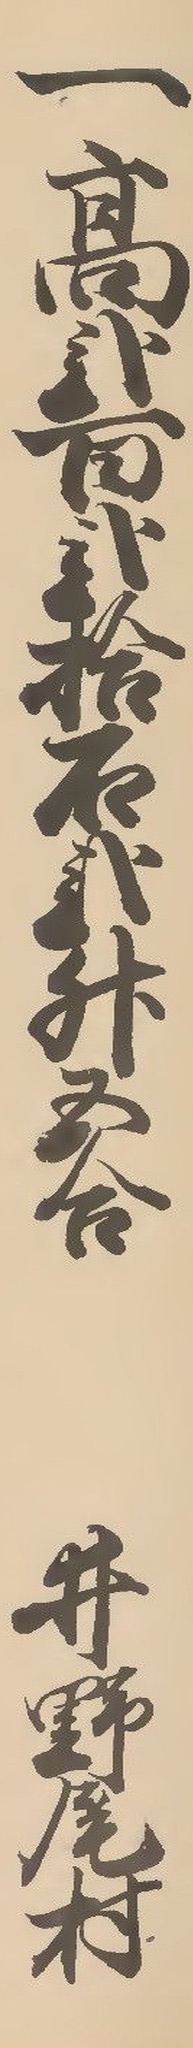一髙弐百弐拾石弐升五合伊野尾村
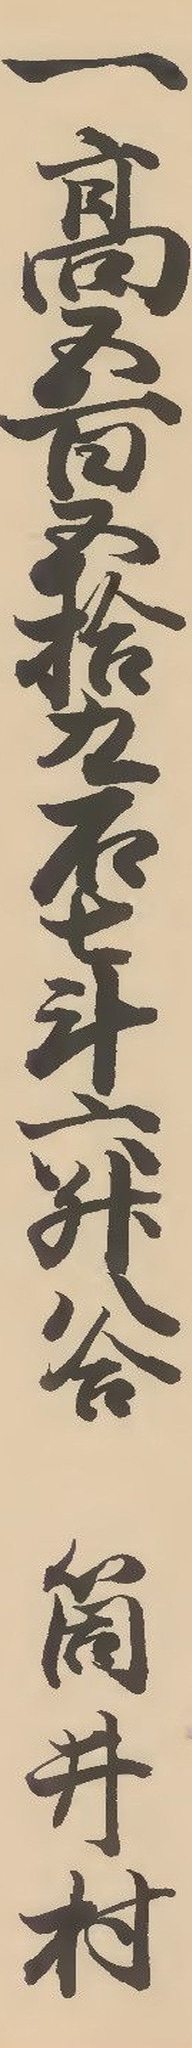一髙五百五拾九石七斗六升八合筒井村
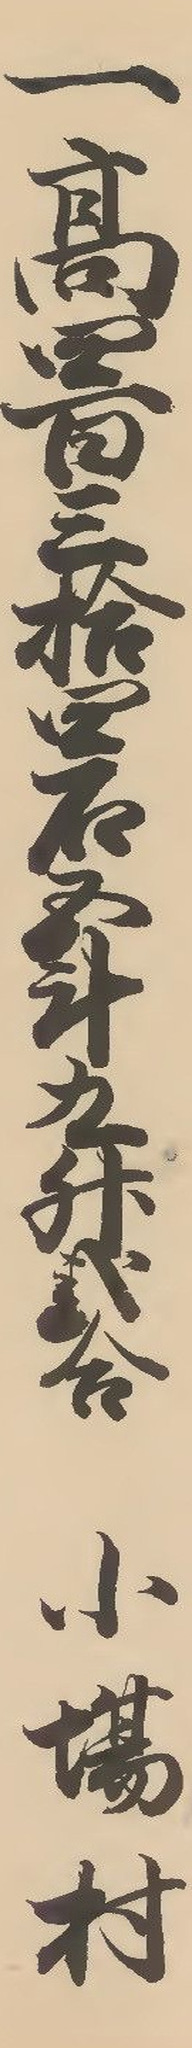一髙四百三拾四石五斗九升弐合木場村
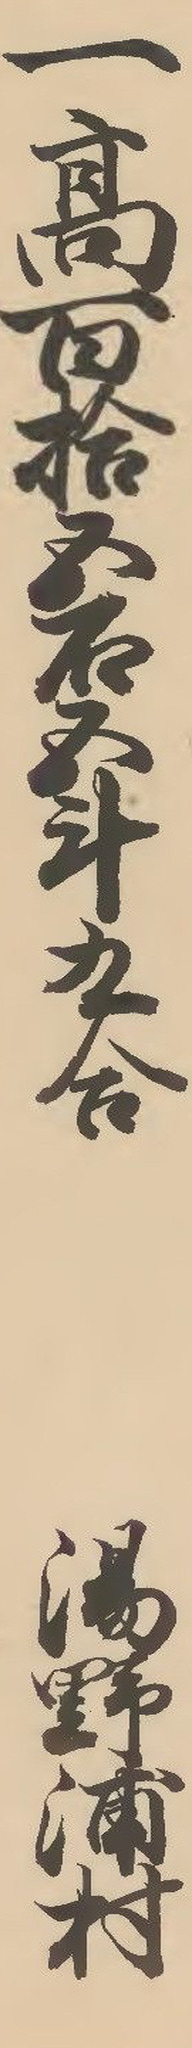一髙百拾五石五斗九合湯野浦村

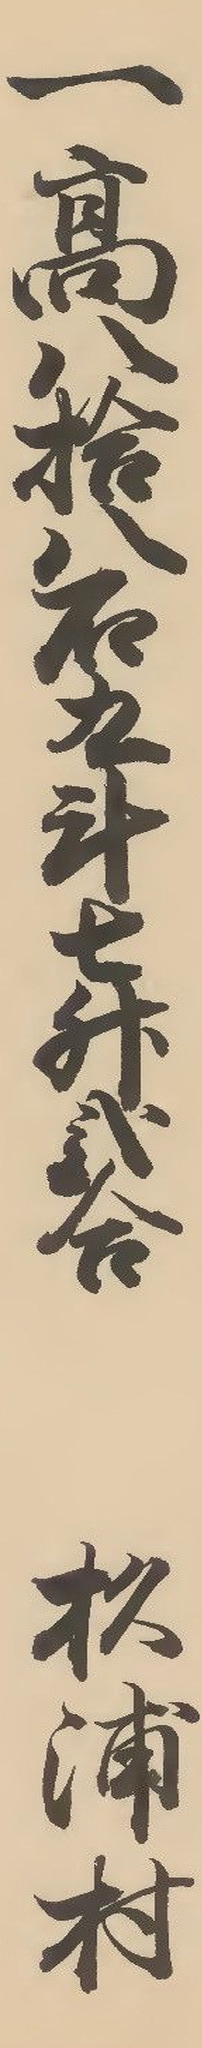一髙八拾八石九斗七升弐合杦浦村
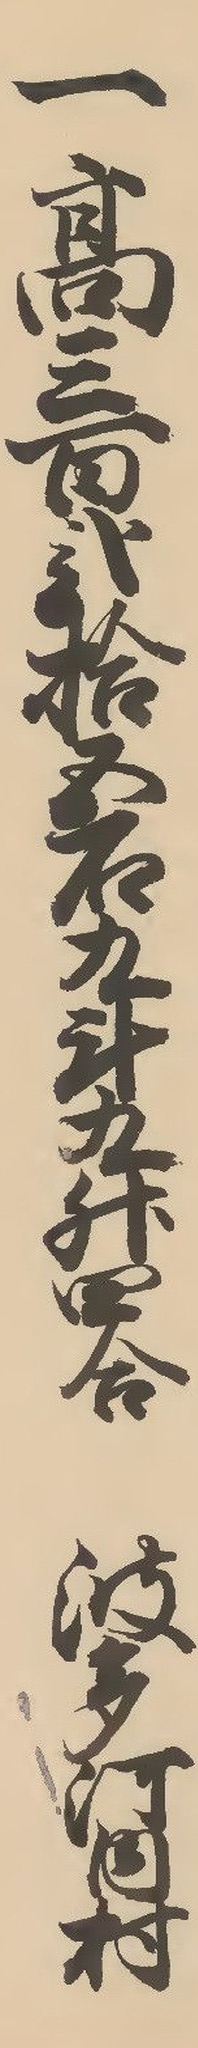一髙三百弐拾五石九斗九升四合花房村
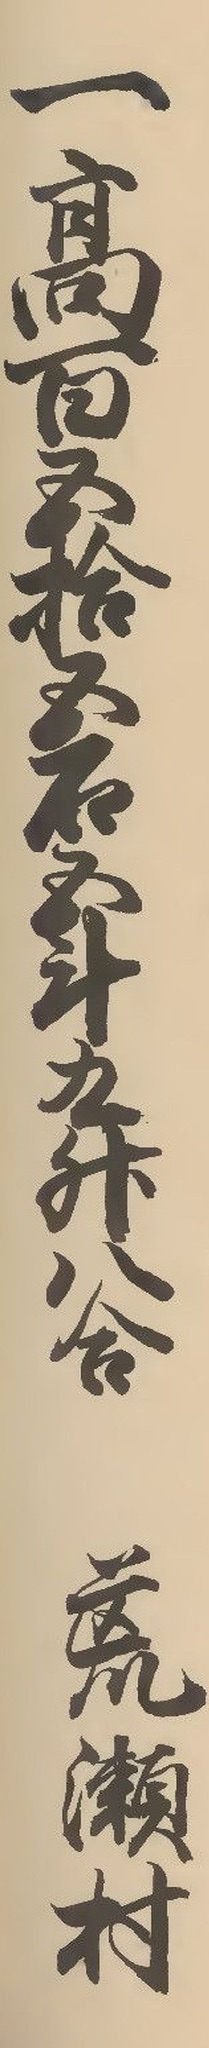一髙百五拾五石五斗九升八合荒瀬村
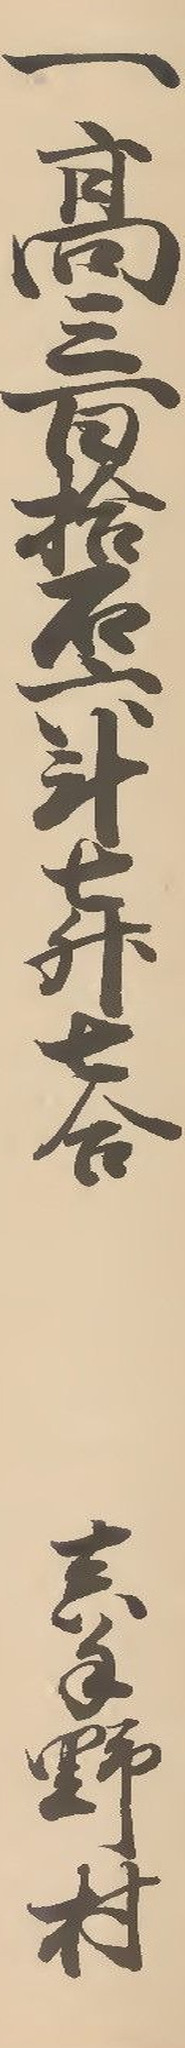一髙三百拾石六斗七升七合真手野村
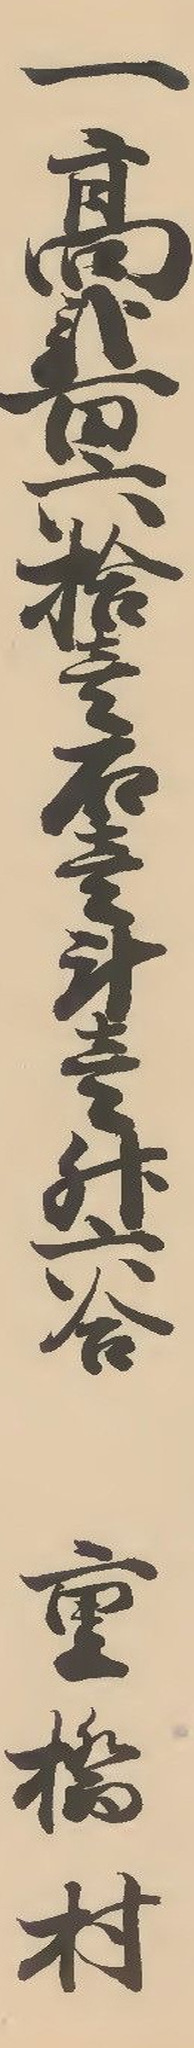一髙弐百六拾壱石壱斗壱升六合重橋村
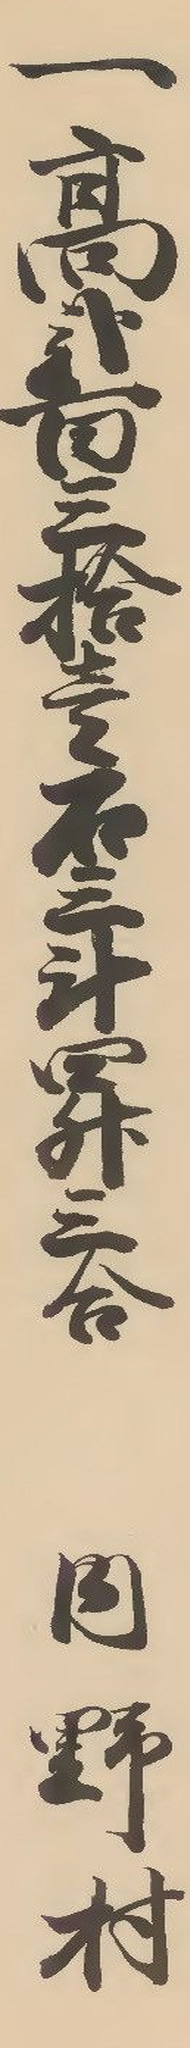一髙弐百三拾壱石三斗四升三号内野村

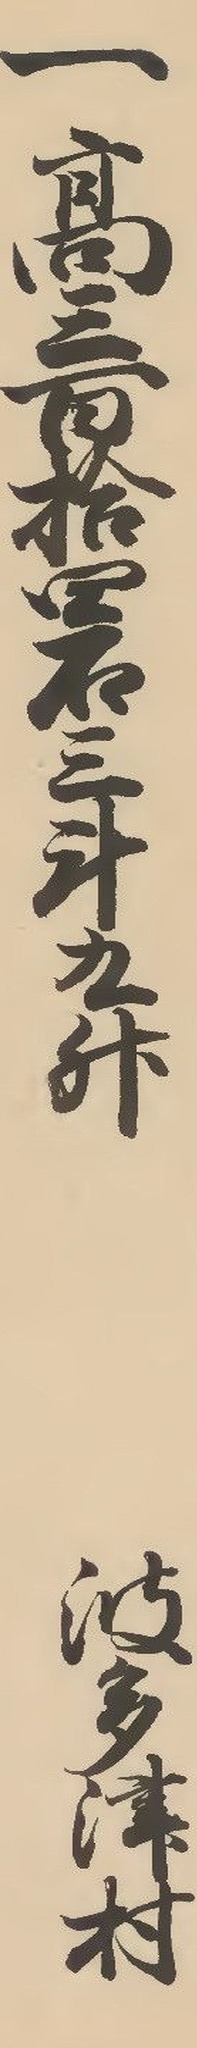一髙三百拾四石三斗九升波多津村
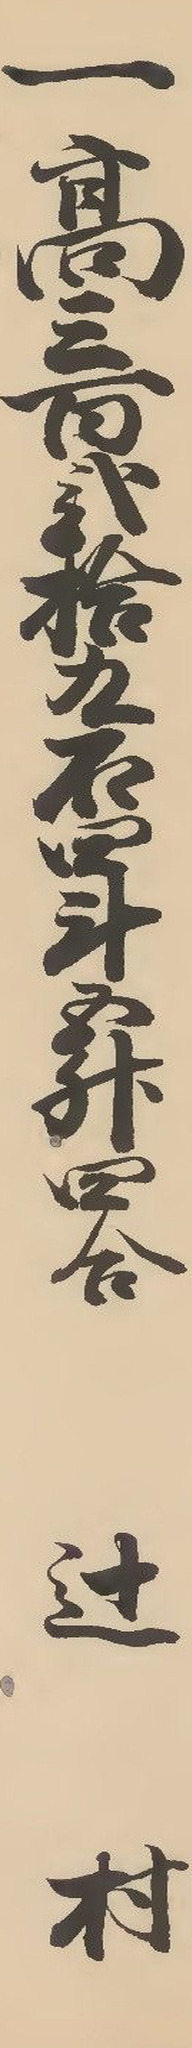一髙三百弐拾九石四斗五升四合辻村
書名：肥前国郷帳
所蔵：国立公文書館 National Archives of Japan
